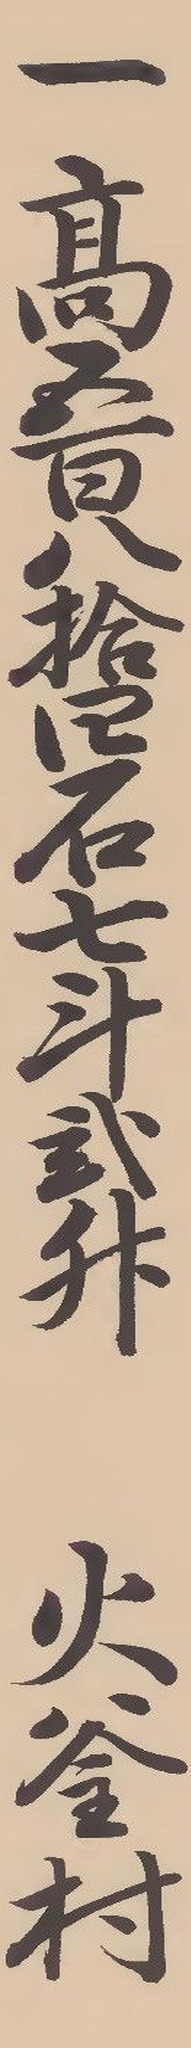一高五百八拾四石七斗弐升火釜村
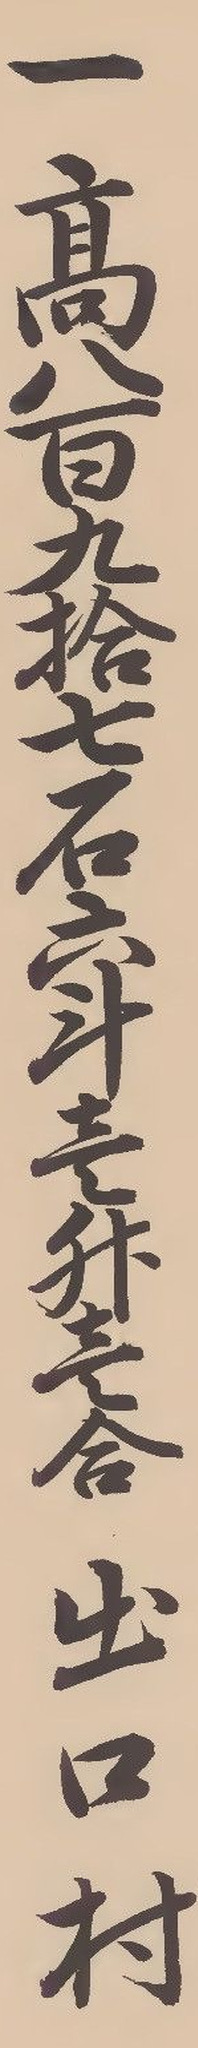一高八百九拾七石六斗壱升壱合出口村
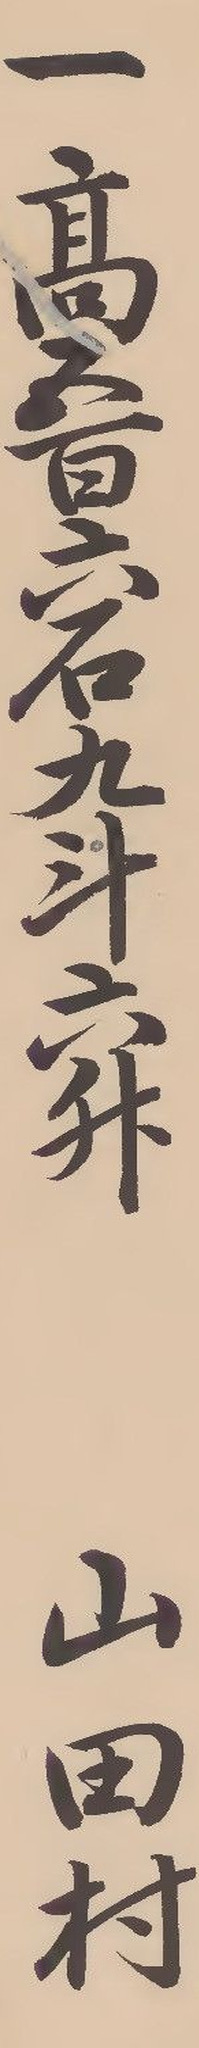一高五百六石九斗六升山田村

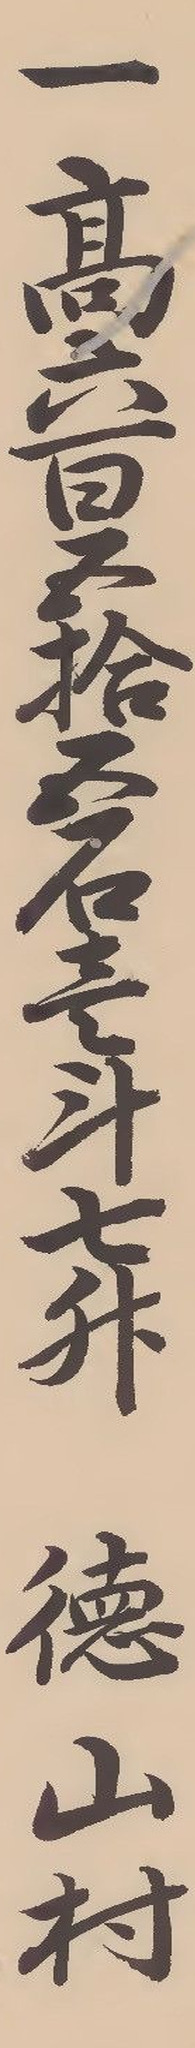一高六百五拾五石壱斗七升徳山村
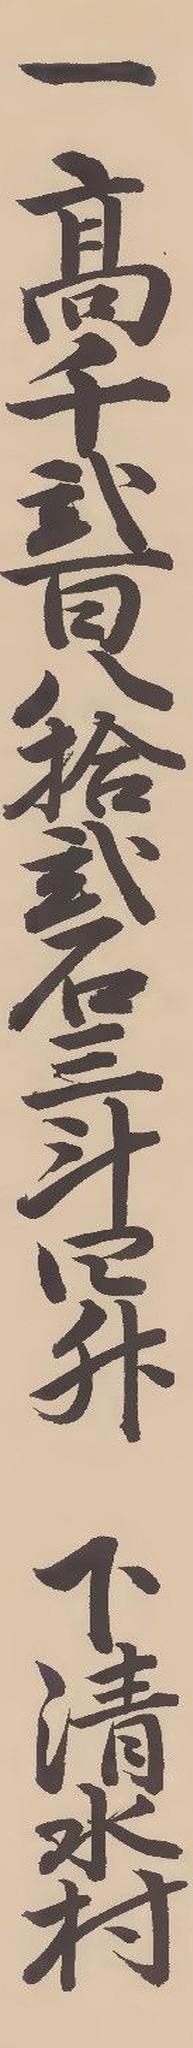一高千弐百八拾弐石三斗四升下清水村
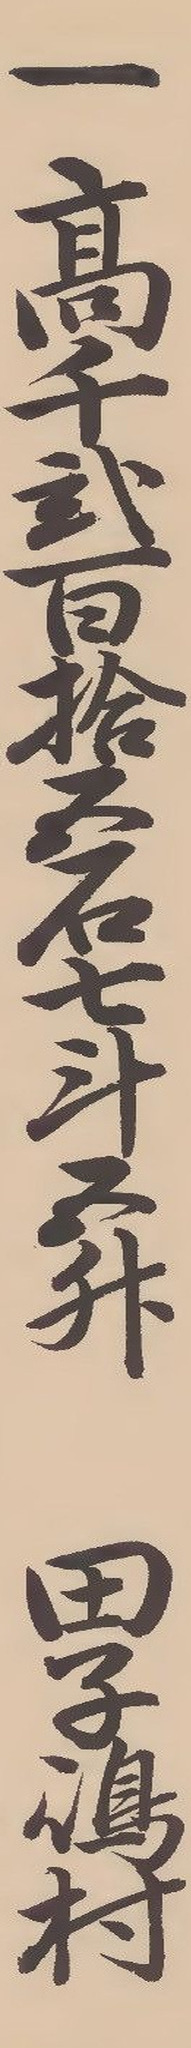一高千弐百拾五石七斗五升田子島村
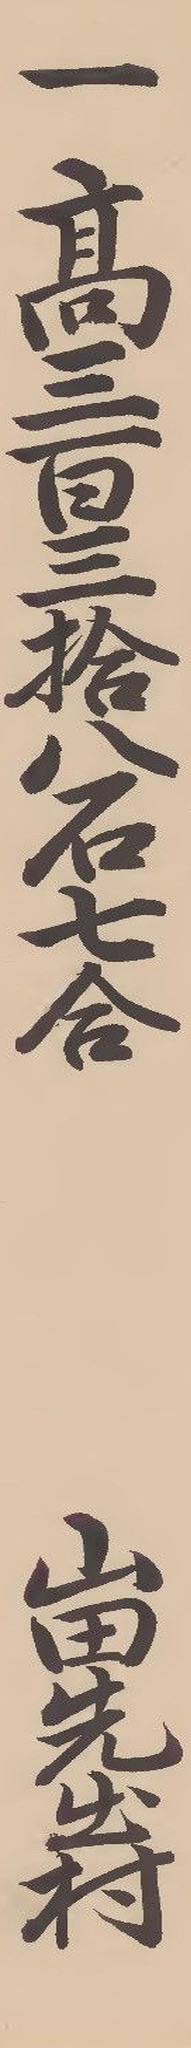一高三百三拾八石七合山田先出村
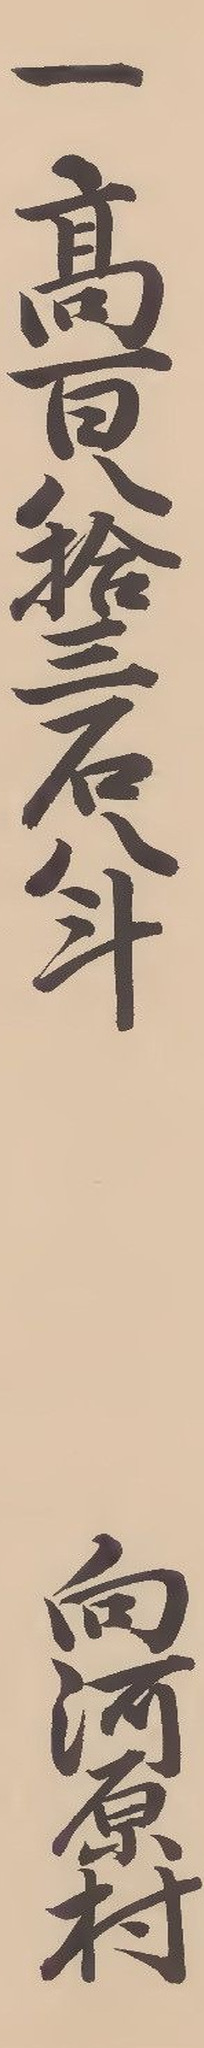一高百八拾三石八斗向河原村

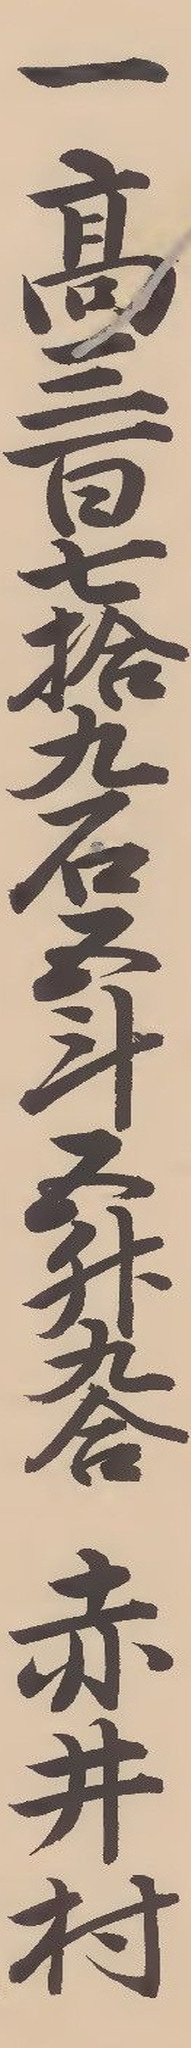一高三百七拾九石五斗五升九合赤井村
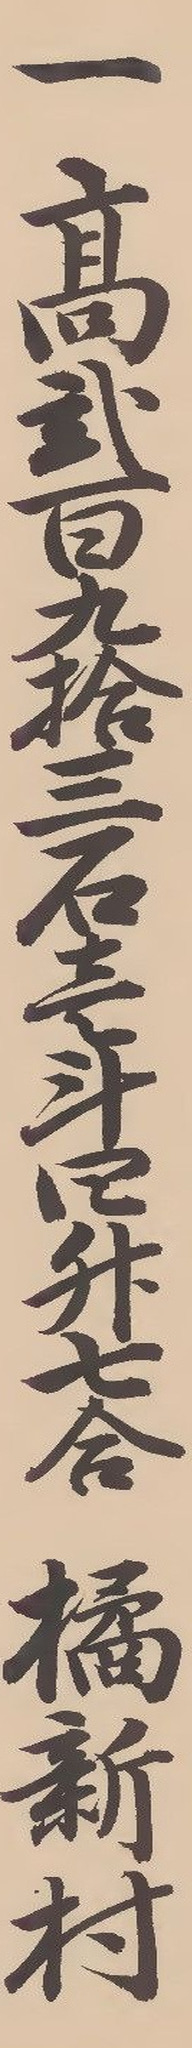一高弐百九拾三石壱斗四升七合橘新村
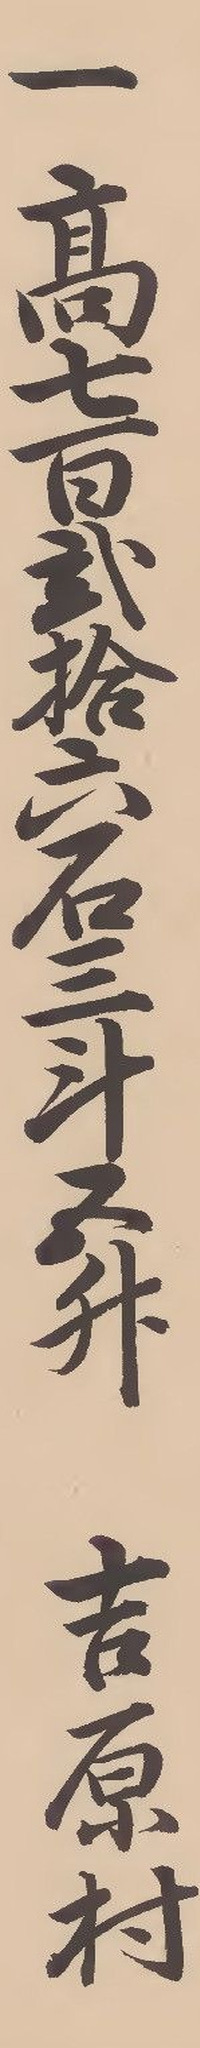一高七百弐拾六石三斗五升吉原村
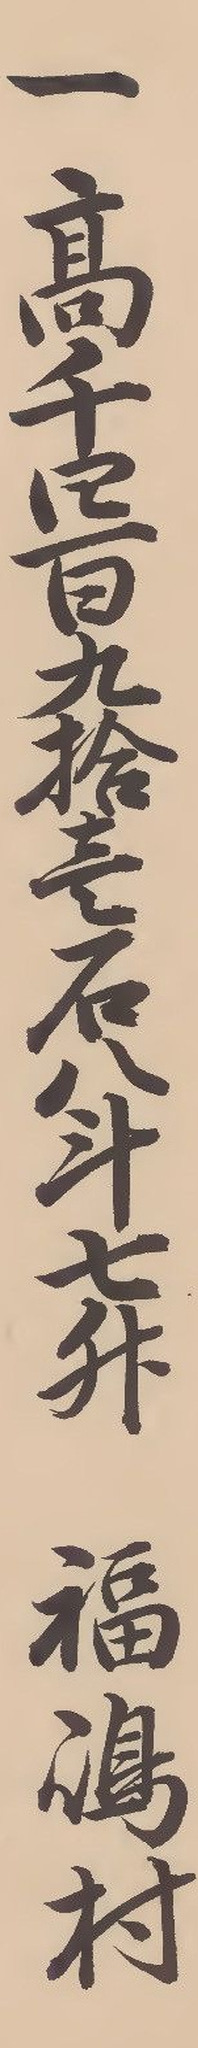一高千四百九拾壱石八斗七升福島村
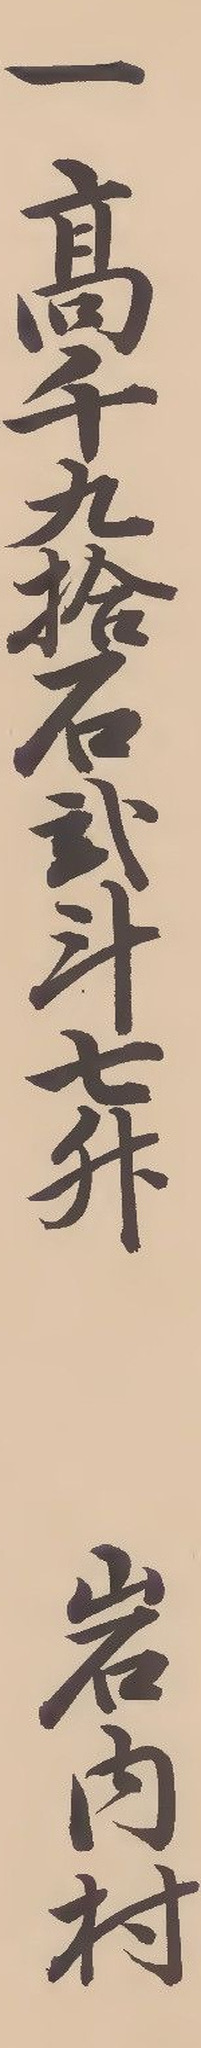一高千九拾石弐斗七升岩内村
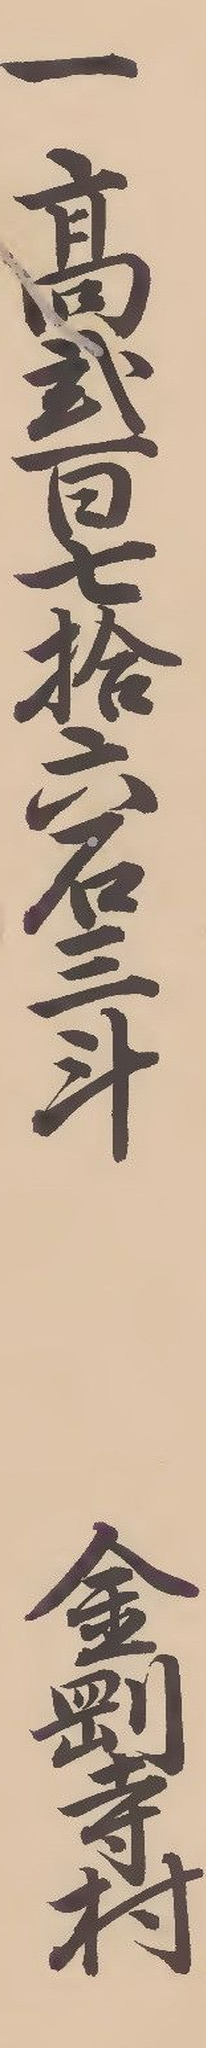一高弐百七拾六石三斗金剛寺村

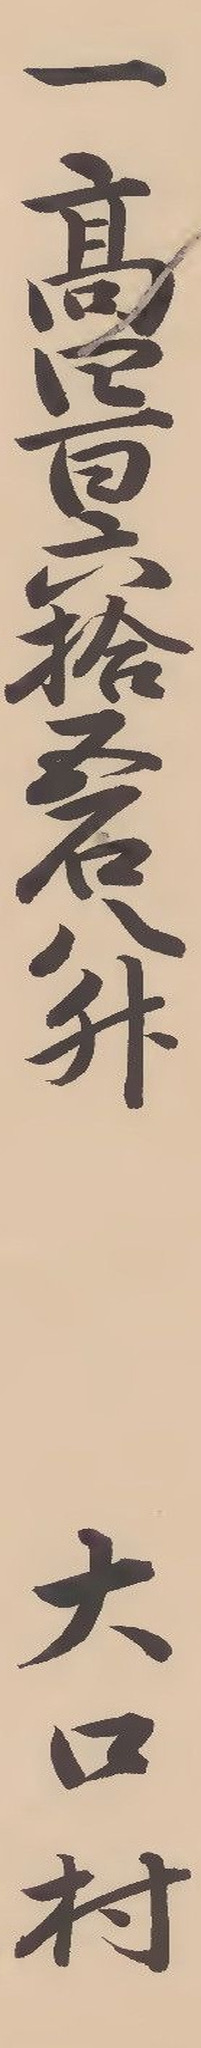一高四百六拾五石八升大口村
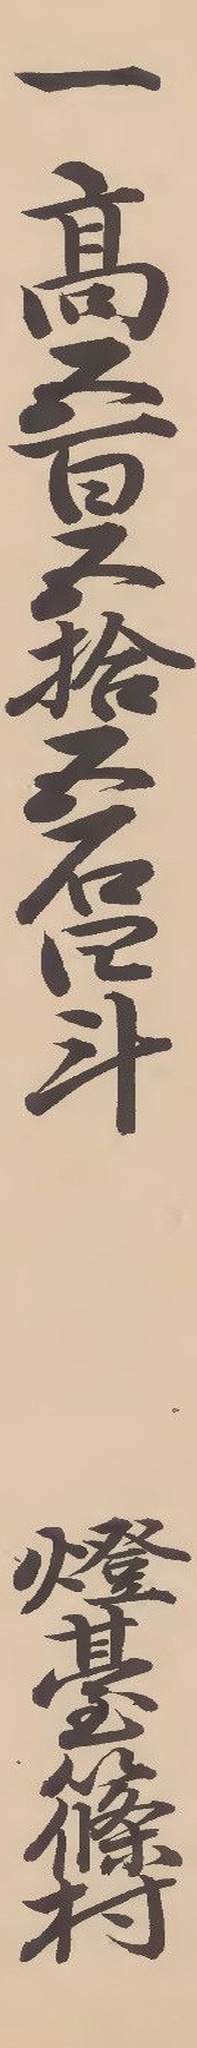一高五百五拾五石四斗灯台篠村
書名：加賀国郷帳
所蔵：国立公文書館 National Archives of Japan
